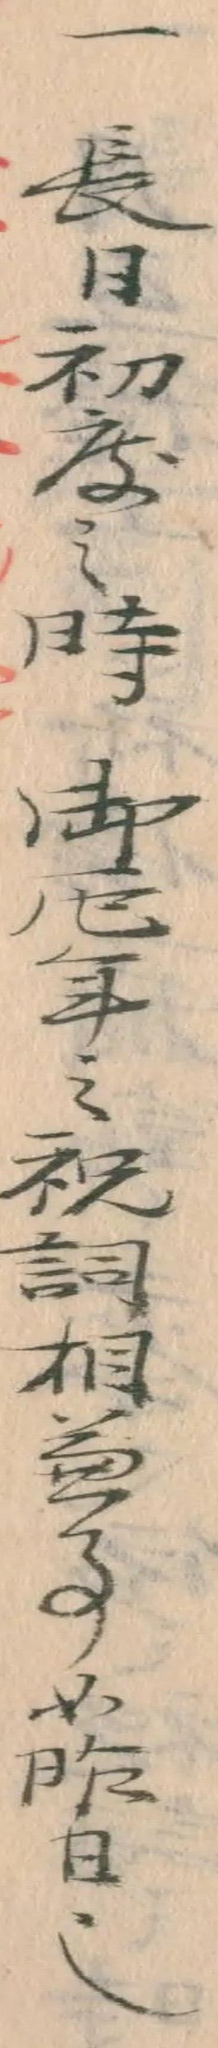一長日初度之時御厄年之祝詞相兼事如昨日也
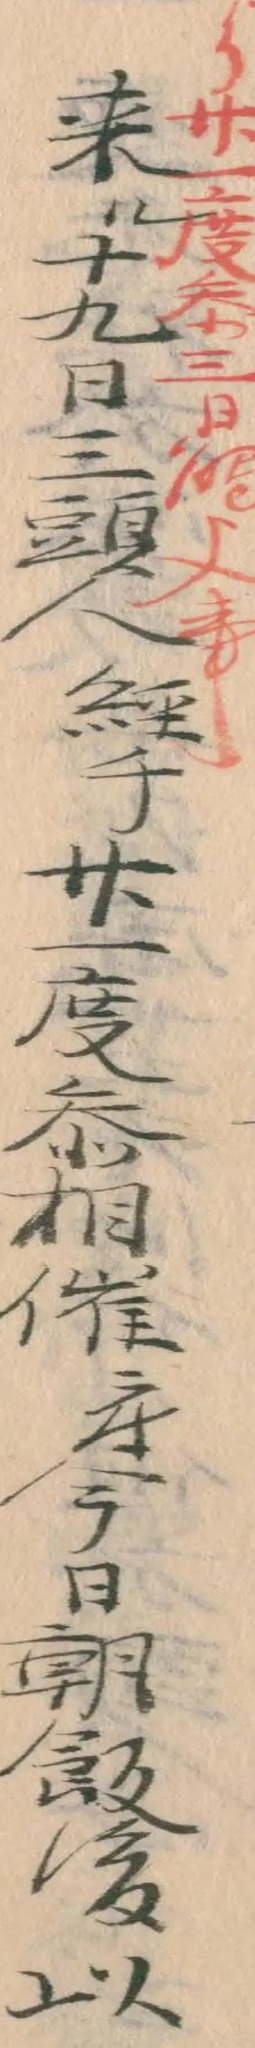一来ル十九日三頭人経千廿一度参相催ニ付今日朝飯後以
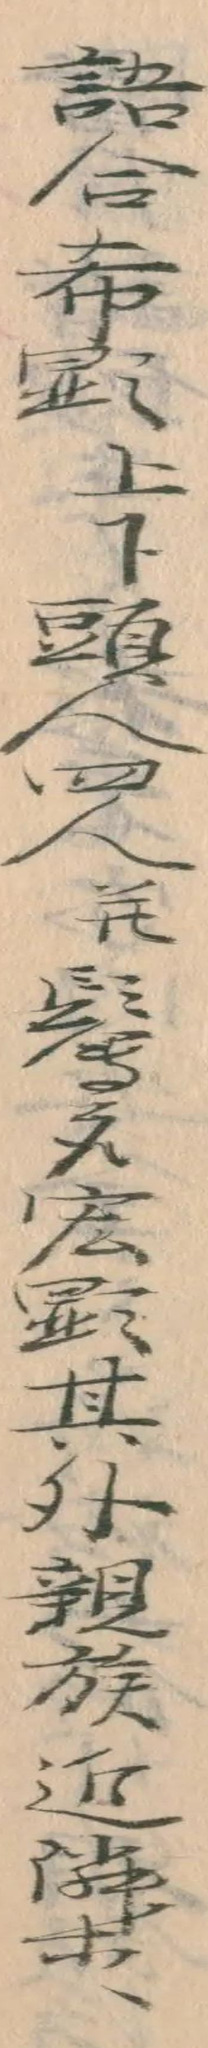語合希顕上下頭人四人并髪取宏顕其外親族近隣等へ
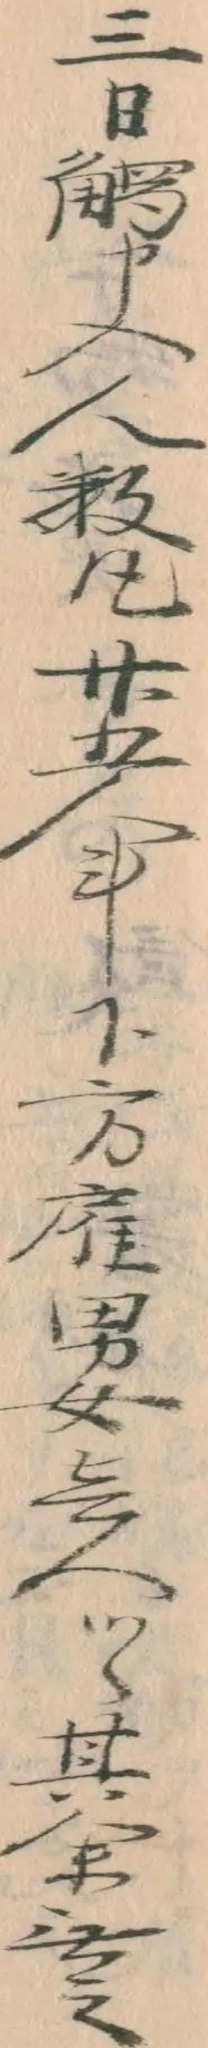三日觸申入人数凡廿五人斗下方雇男女壱人ツヽ其余無之
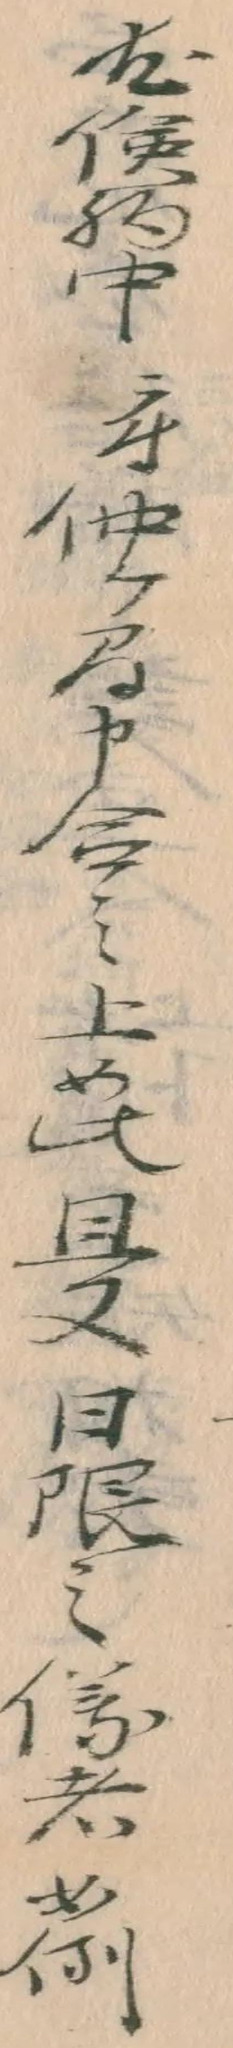尤倹約中ニ付仲ヶ間申合之上如此且又日限之儀者如例
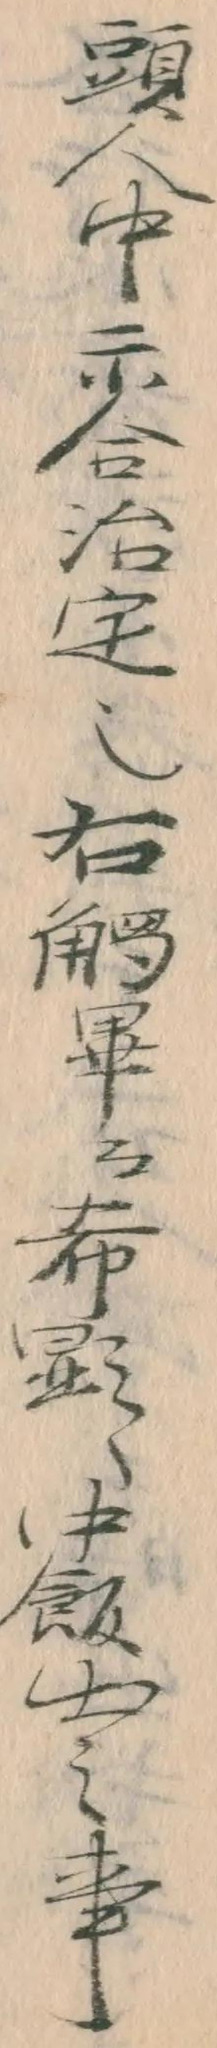頭人中示合治定也右觸畢而希顕へ中飯出之事
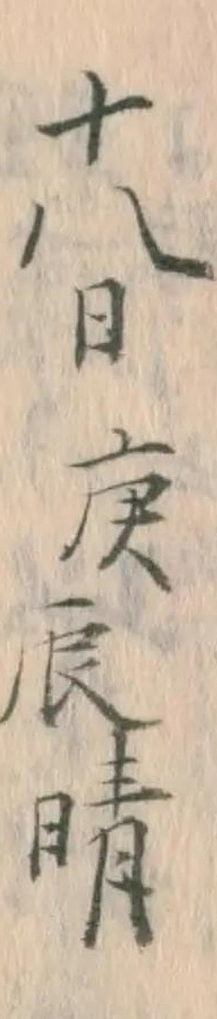十八日庚辰晴
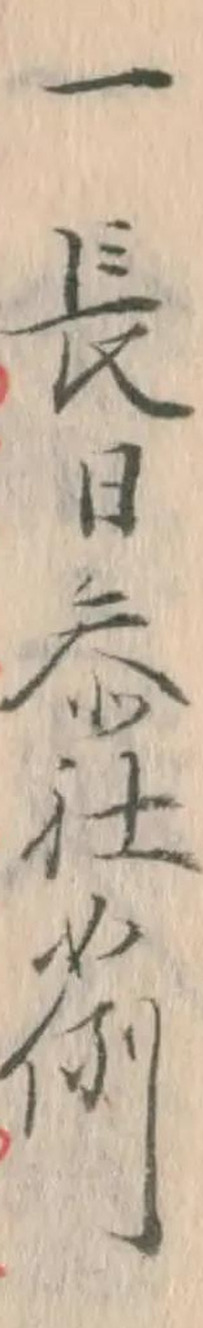一長日参社如例
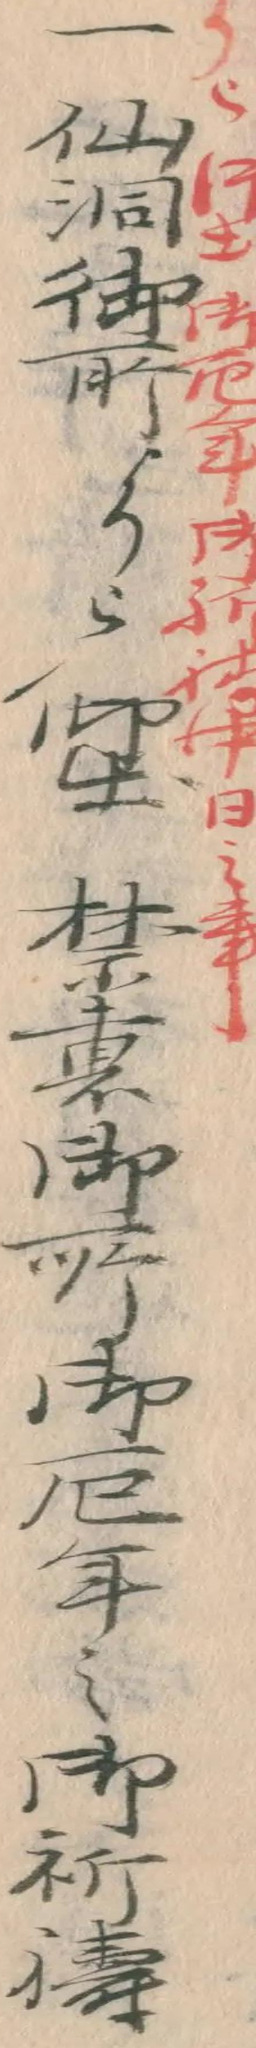一仙洞御所より被仰出禁裏御所御厄年之御祈祷
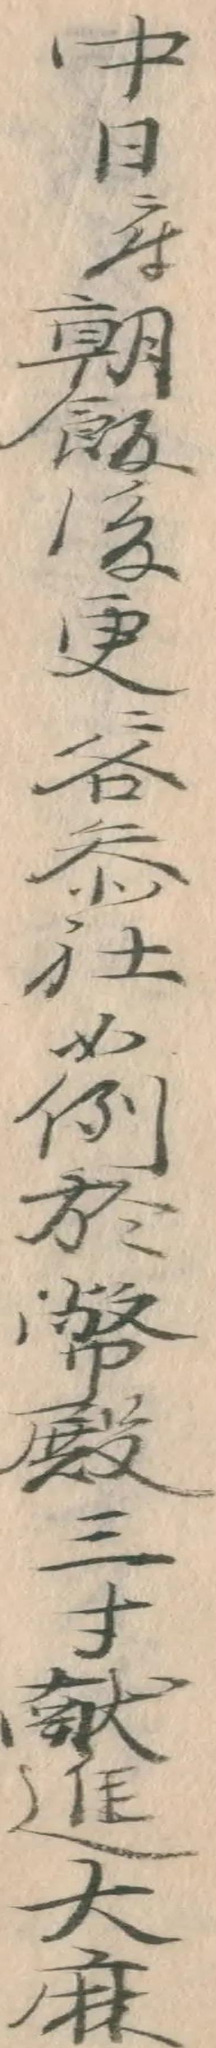中日ニ付朝飯後更ニ各参社如例於幣殿三寸献進大麻
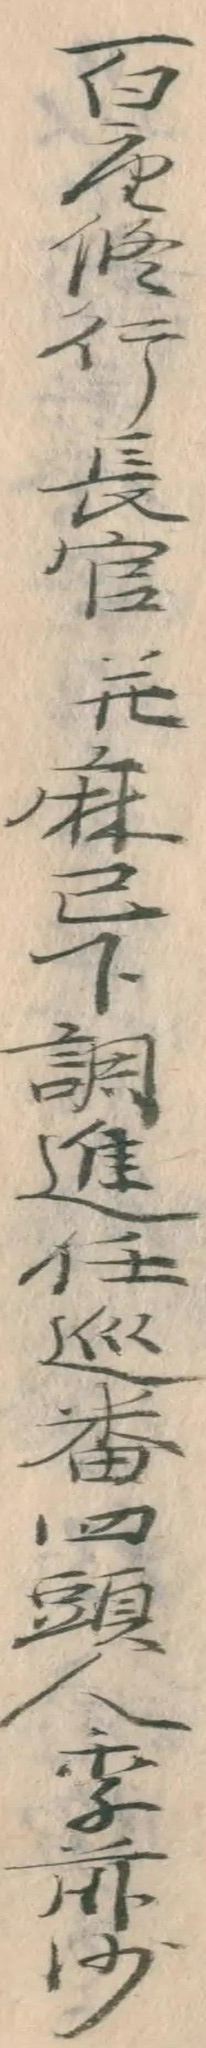百座修行長官并麻已下調進任巡番四頭人季前沙
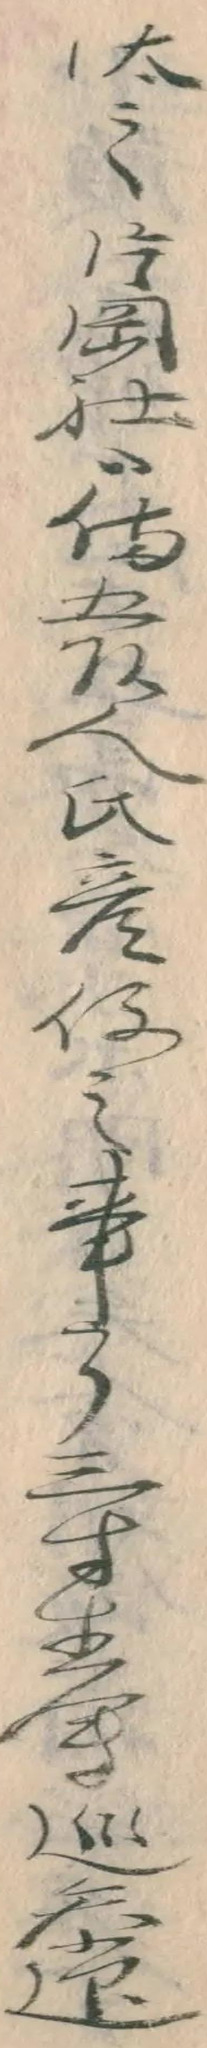汰之片岡社御備五頭人氏彦役之事了三寸直會巡参退
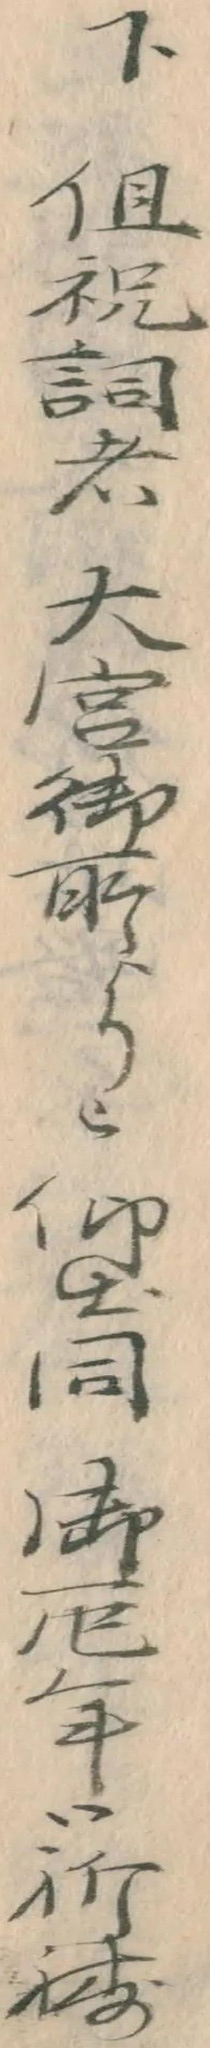下但祝詞者大宮御所より被仰出同御厄年御祈祷

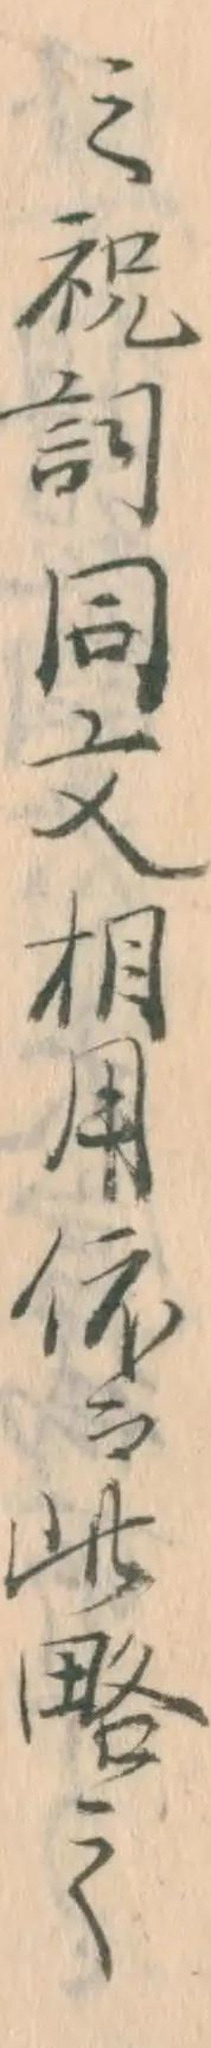之祝詞同文相用依而此略之
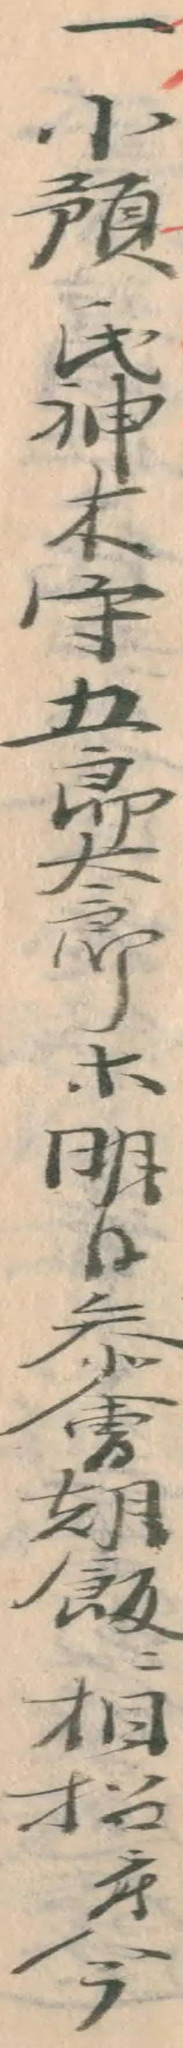一小預氏神木守五郎太郎等明日参會朝飯ニ相招ニ付今
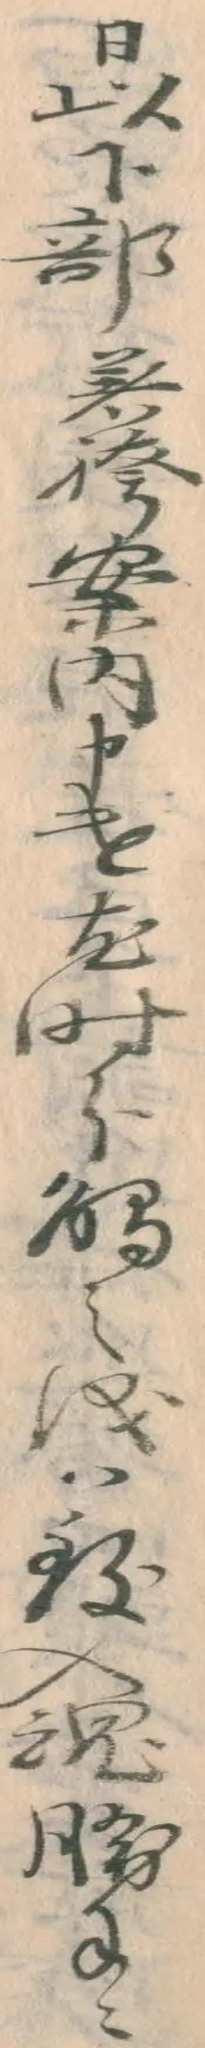日以下部兼袴案内申遣尤時分觸之儀ハ致入魂勝手二
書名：賀茂社記録. 第73冊
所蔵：国立国会図書館 National Diet Library, JAPAN
